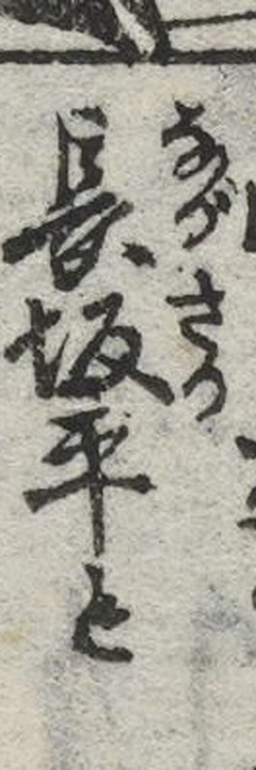長坂平と
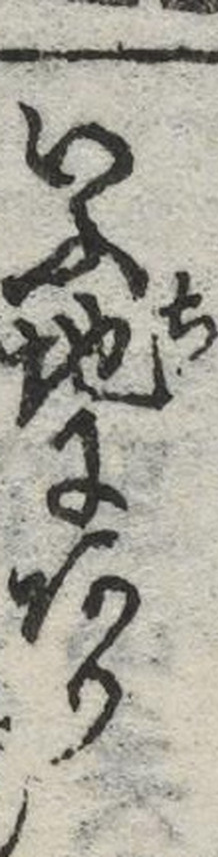いふ地にあり
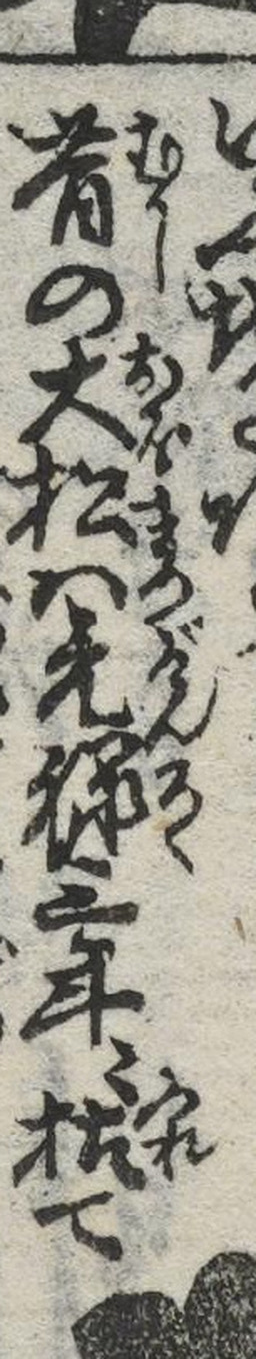昔の大松は元禄六年に枯て
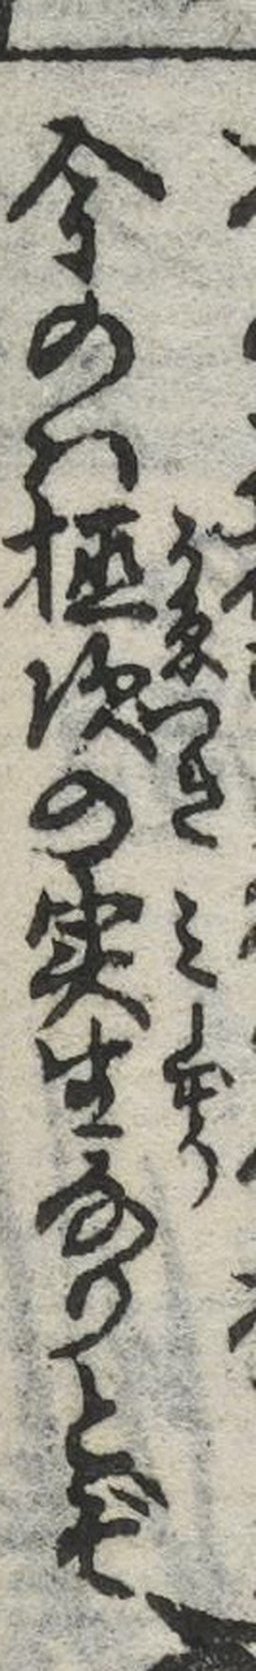今のは植次の実生なりとぞ
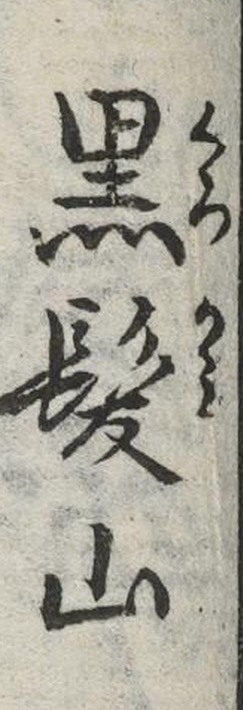黒髪山
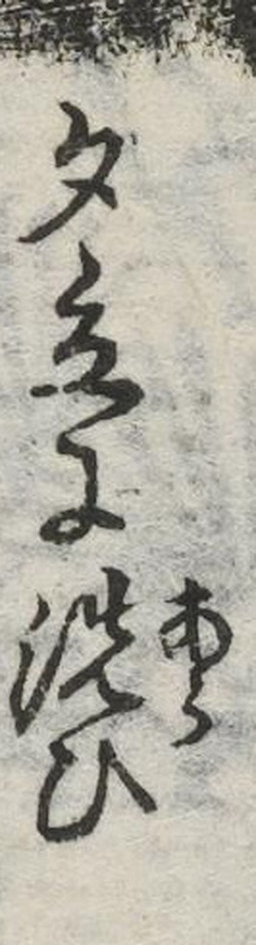夕立に洗ひ
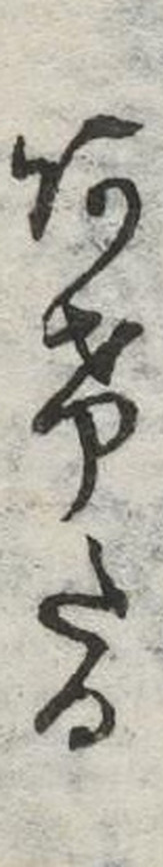あけたる
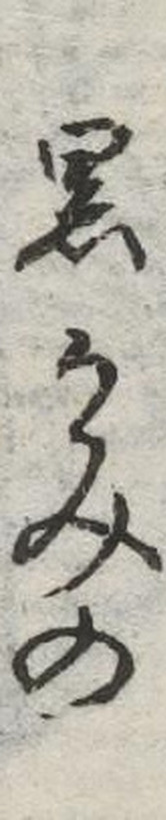黒かみの
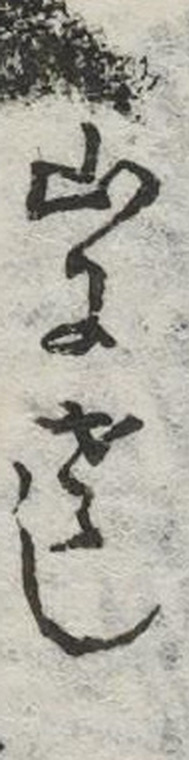山にさし
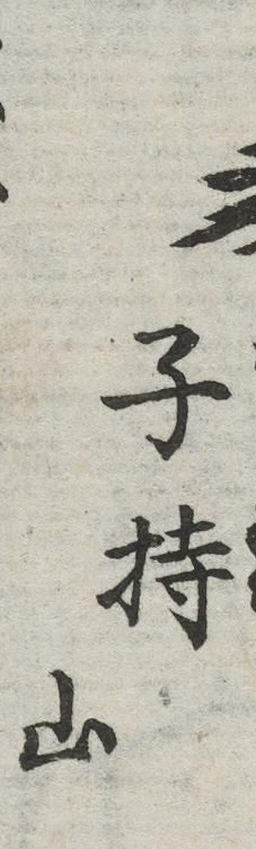子持山
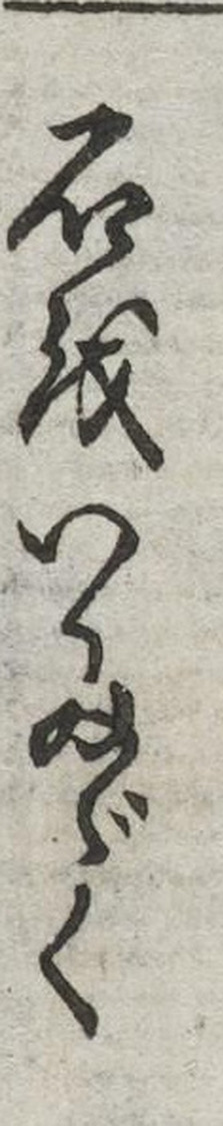石をいたゞく
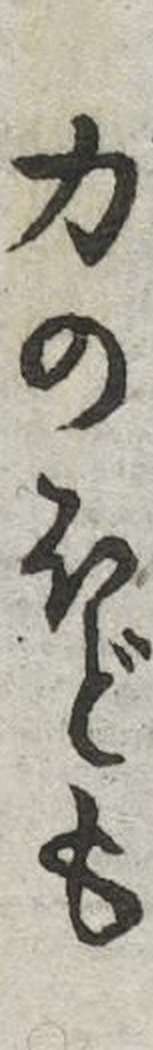力のほども
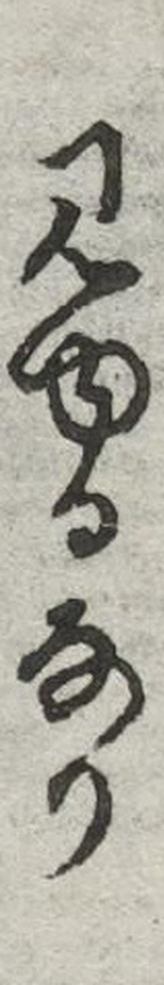見ゆるなり
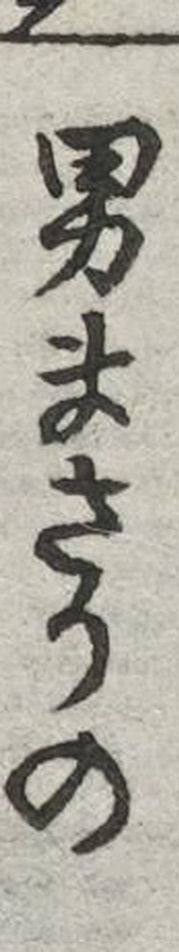男まさりの
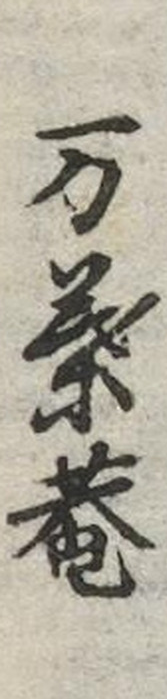万葉菴

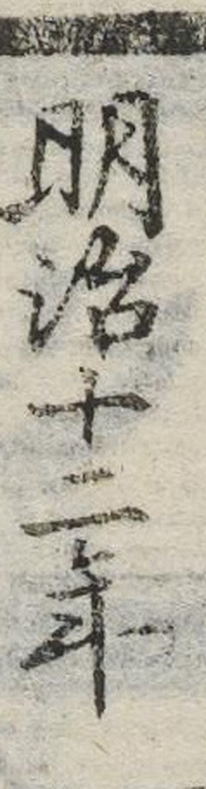明治十二年
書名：諸國温泉遊覽記　全
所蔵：東京大学地震研究所図書室 Earthquake Research Institute Library, The University of Tokyo, JAPAN
